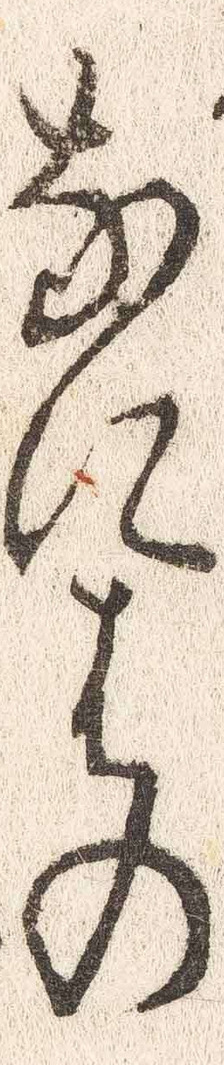なにはの
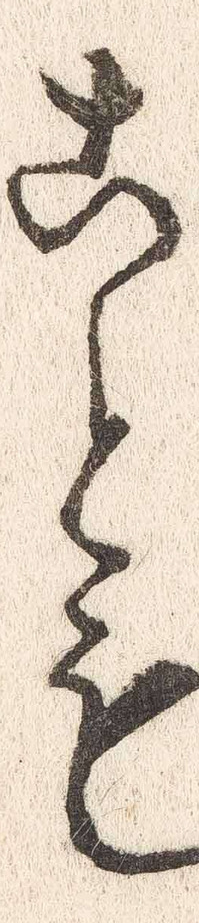ことも
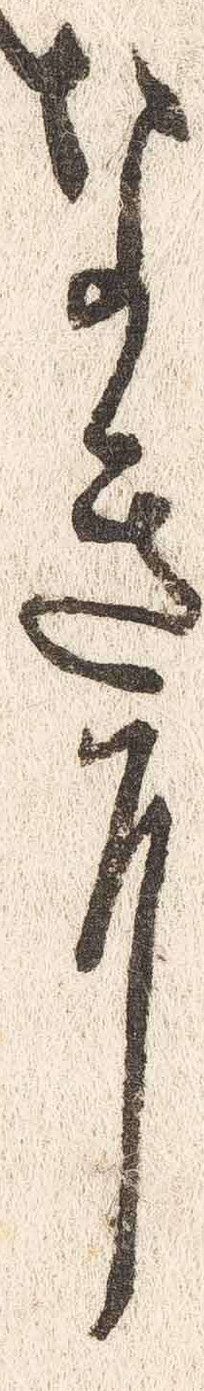なきに
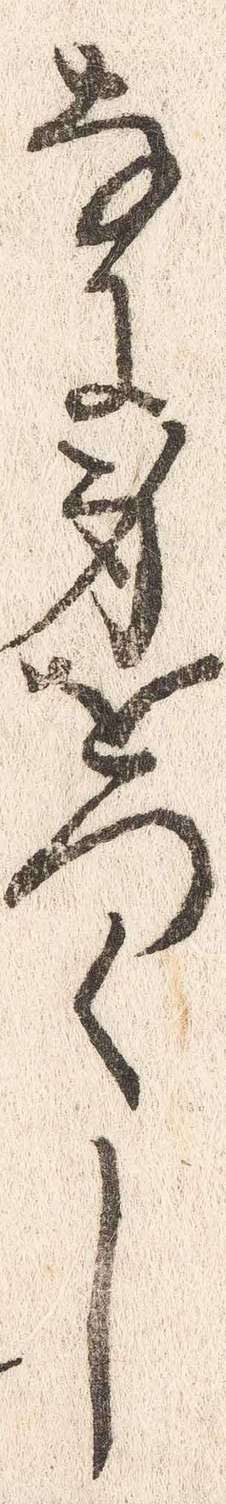なに身をつくし
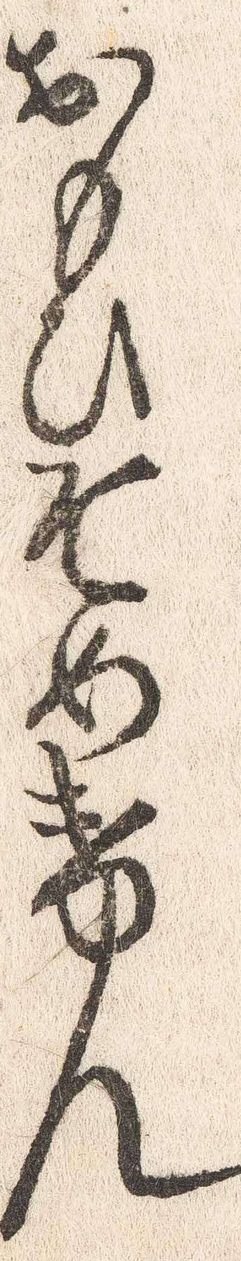おもひそめけん

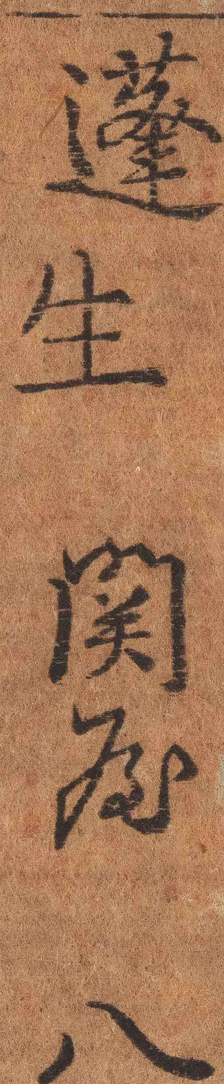蓬生関屋八

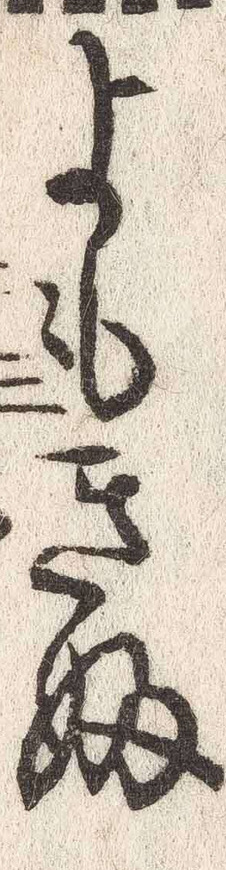よもきふ
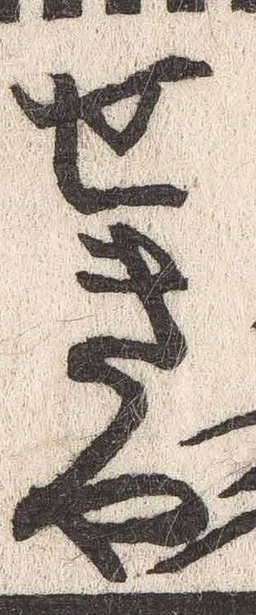せきや

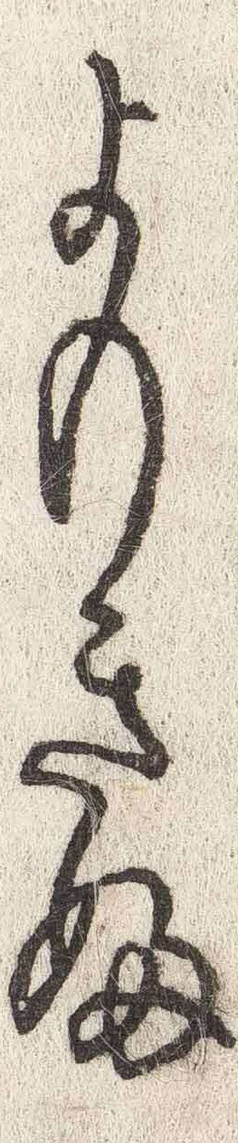よもきふ
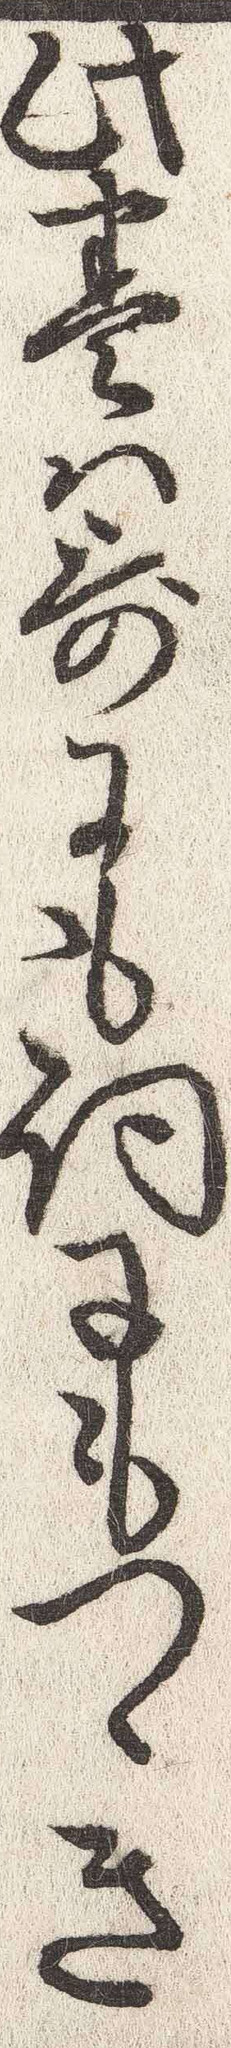此巻は歌にも詞にもつゝき
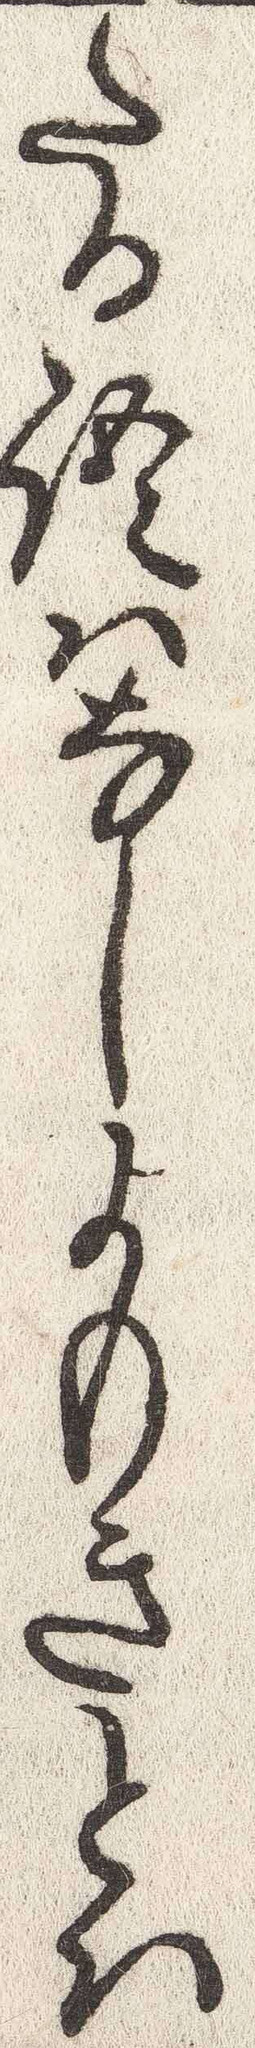たる語はなしよもきとは
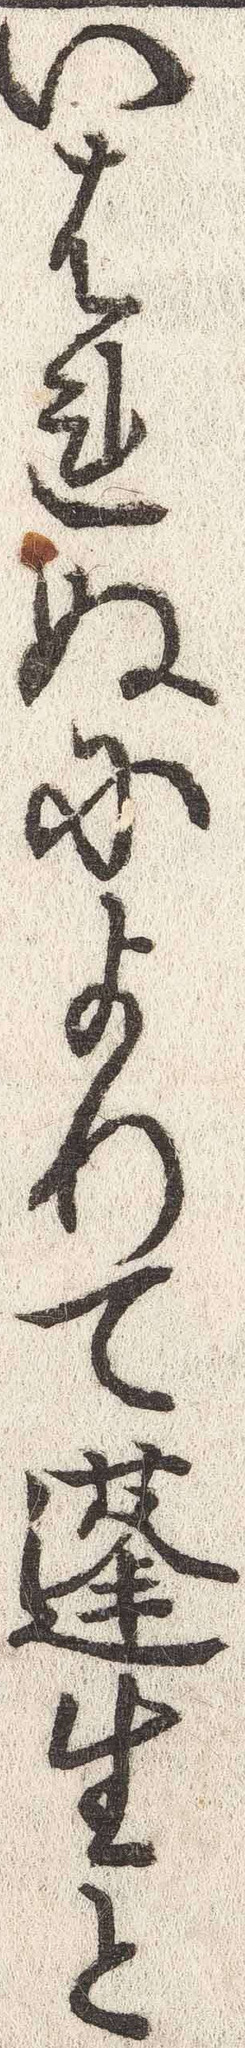いはれぬによりて蓬生と
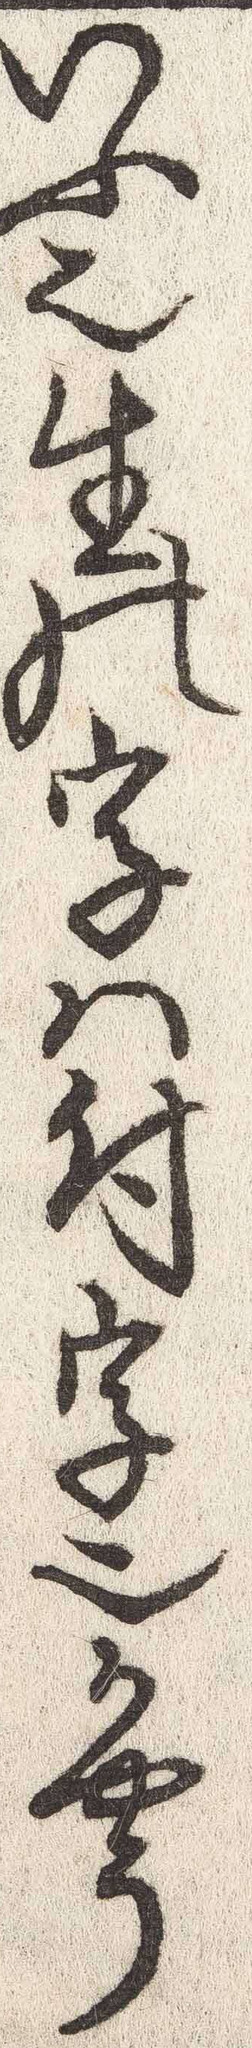いふ也生の字は付字也かやう
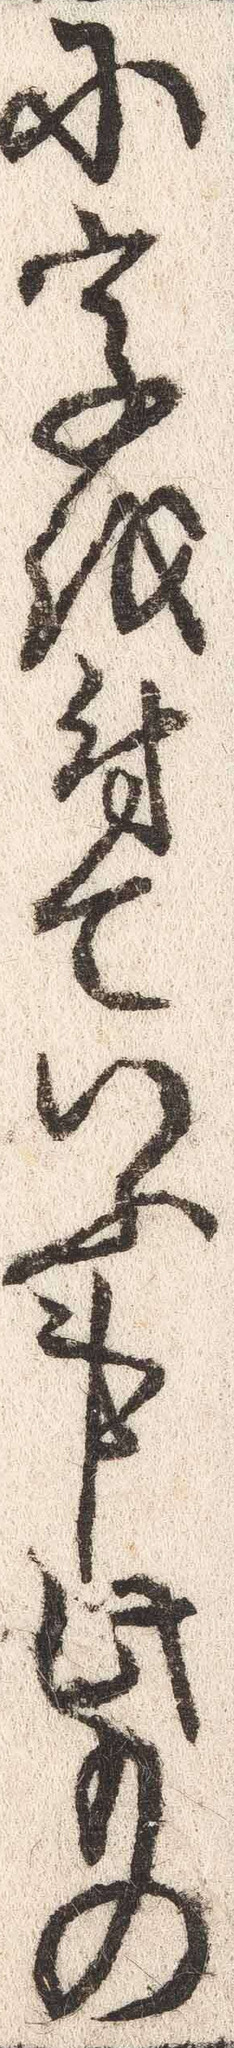に字を付ていふ事此もの
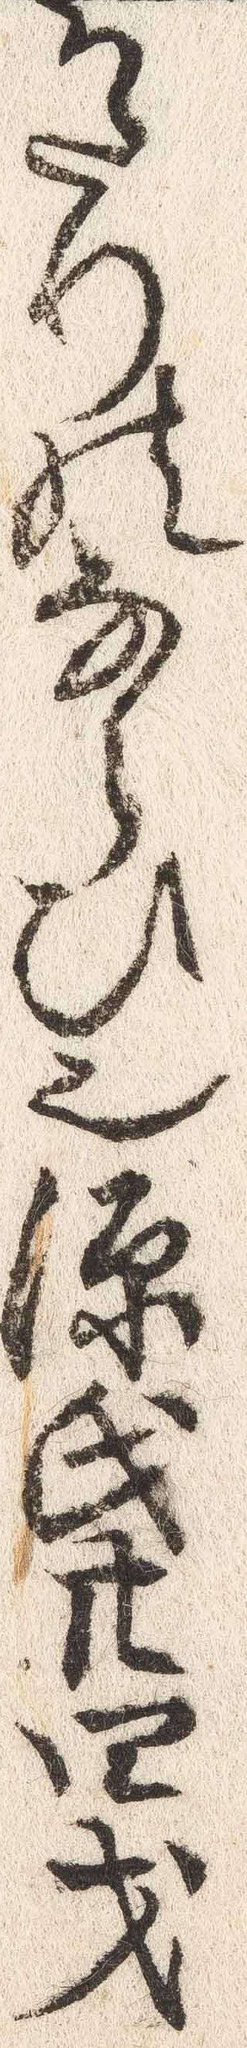かたりのならひ也源氏廿四才
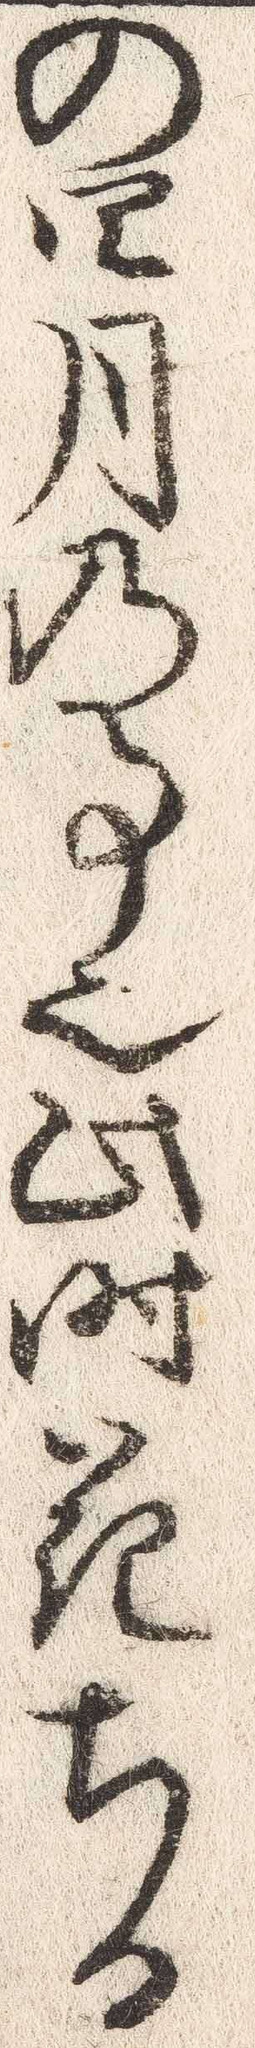の四月の事也此時花ちる
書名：源氏物語
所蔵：東京学芸大学附属図書館 国文学研究資料館
